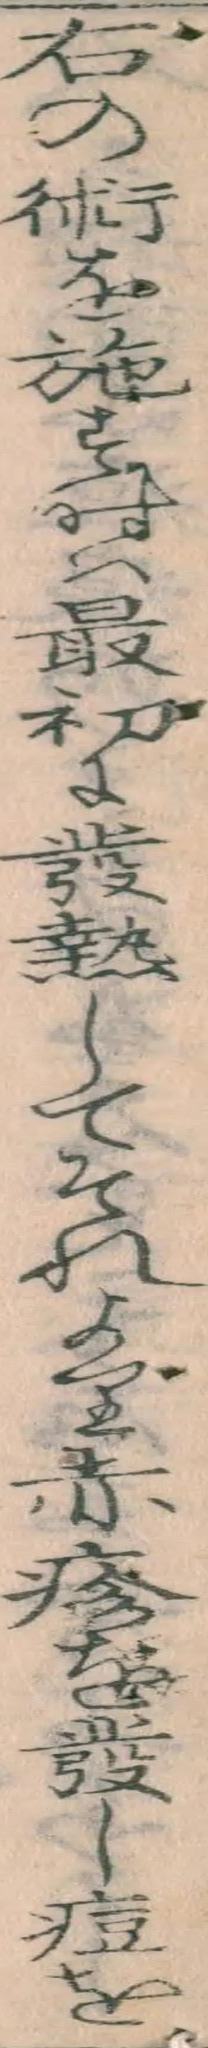右の術を施す時は最初に發熱してそれより赤疹を發し痘を
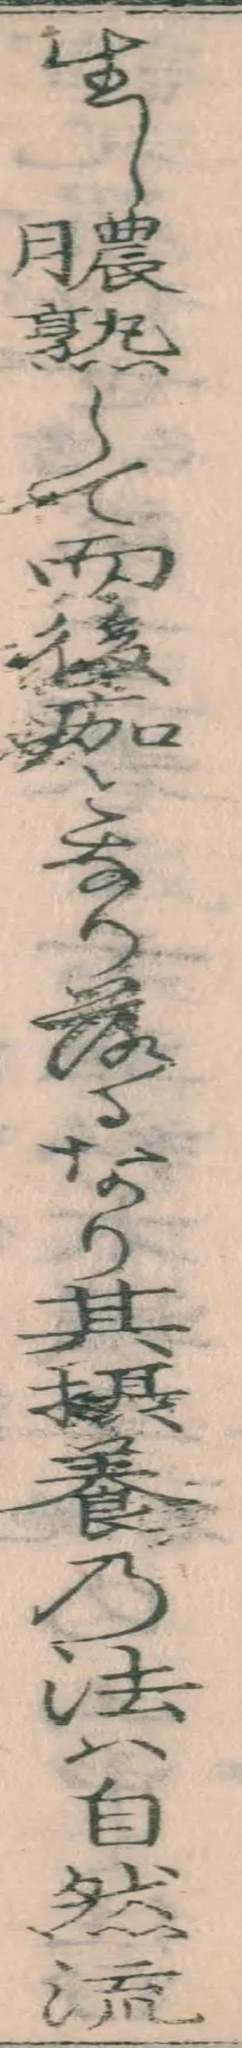生し膿熟して而後痂となり落るなり其摂養乃法は自然流
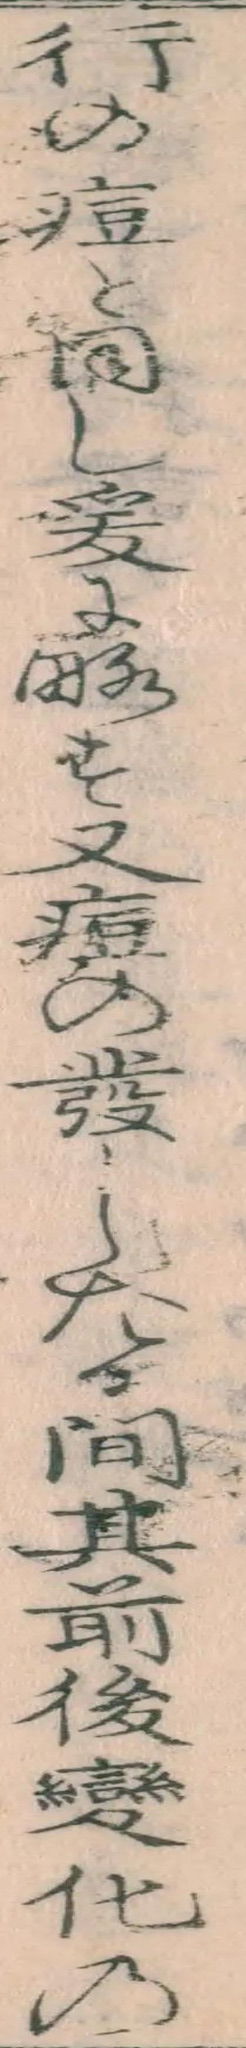行の痘と同し爰に暇す又痘の發したる間其前後變化乃
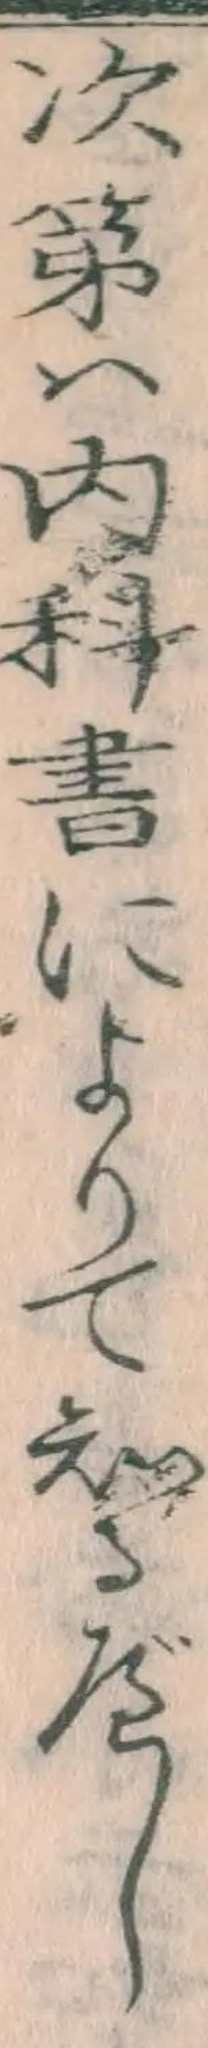次第は内科書によりて知るべし
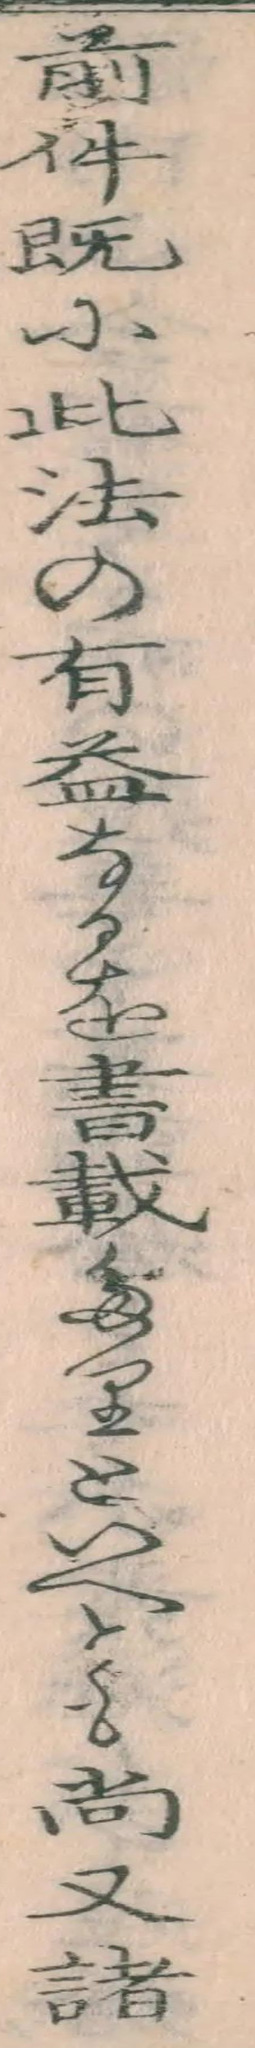前件既に此法の有益なるを書載たりといへとも尚又諸
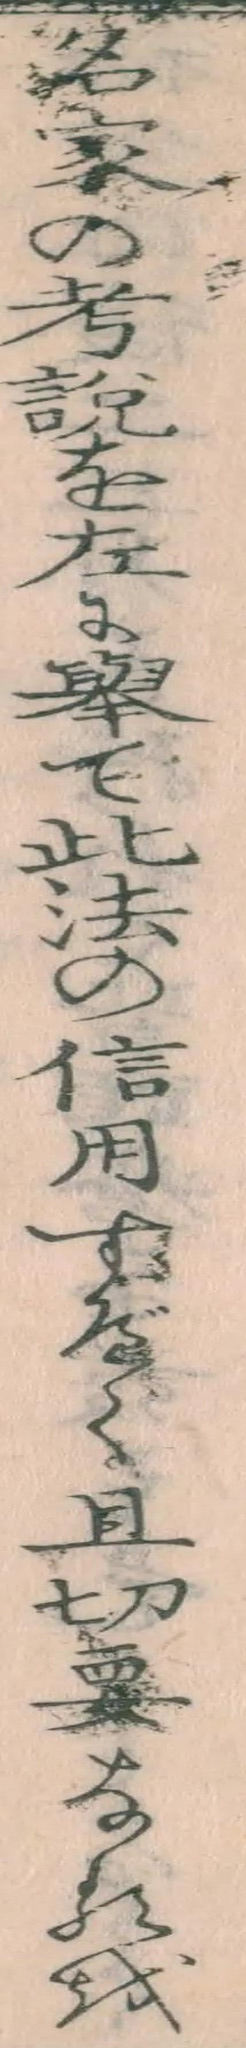名家の考説を左に學て此法の信用すべく且切要なるを
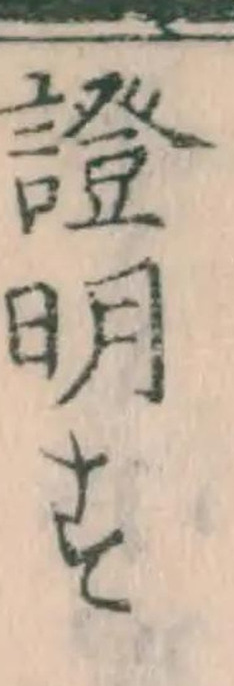證明す
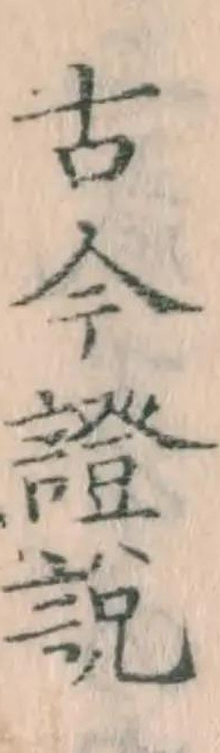古今證説
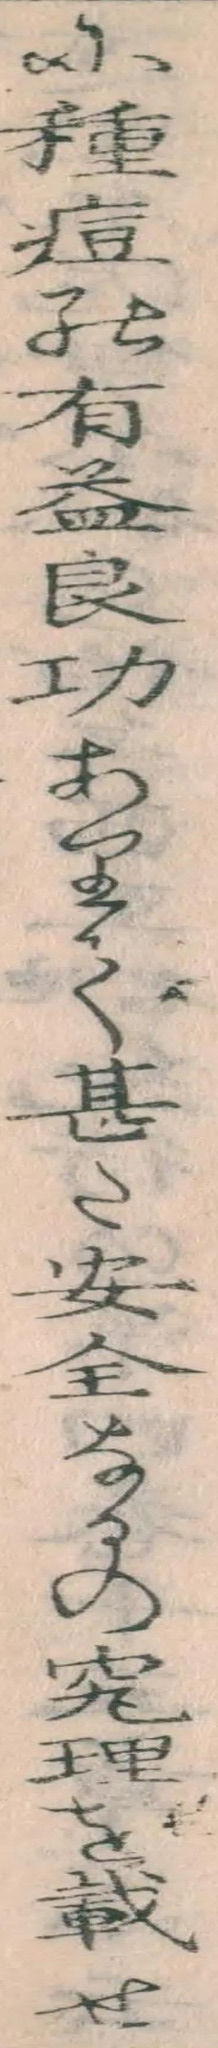に種痘の有益良功ありて甚た安全なるの究理を載せ
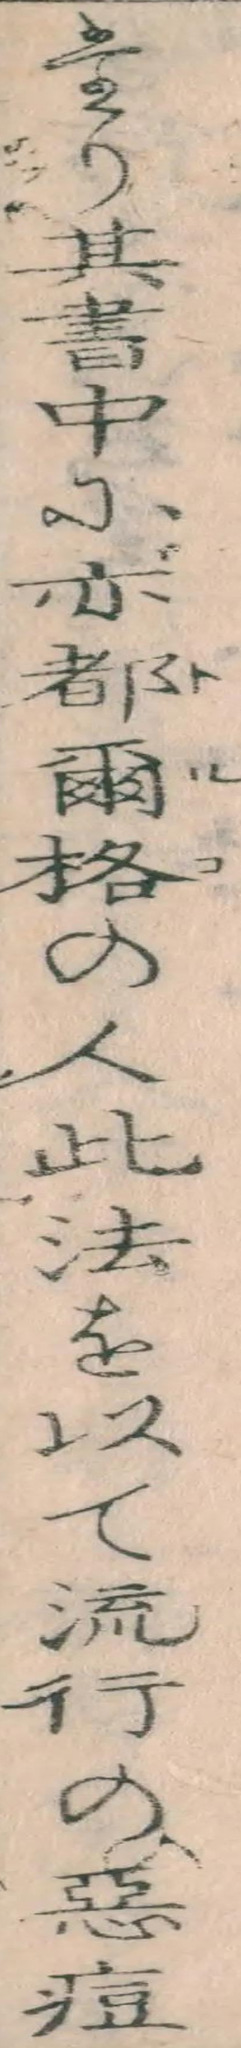たり其書中に亦都爾格の人此法を以て流行の惡痘

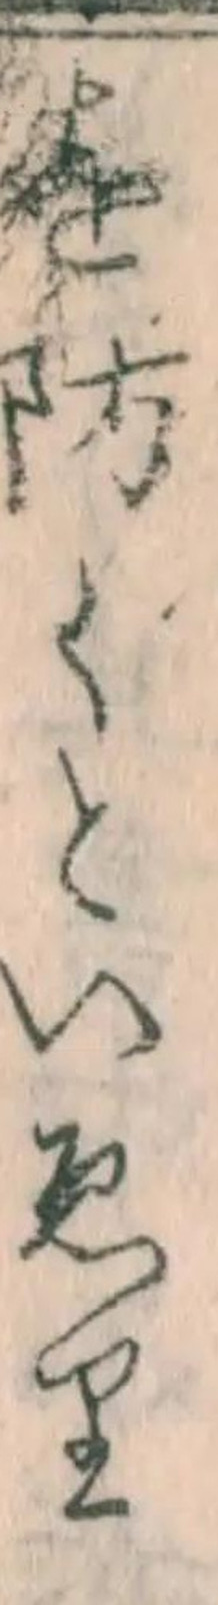を防くといゑり
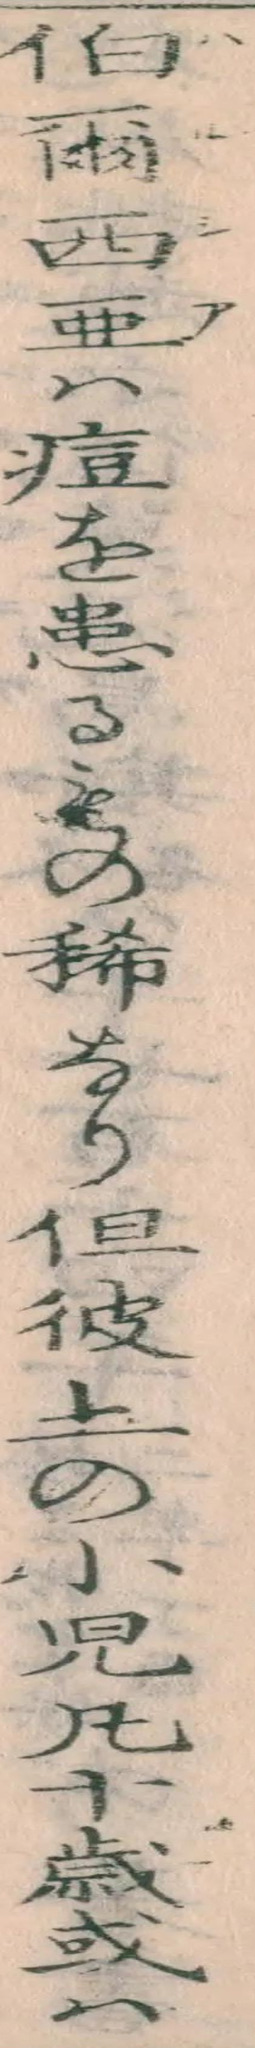伯爾西亜は痘を患るもの稀なり但彼土の小児凡十歳或は
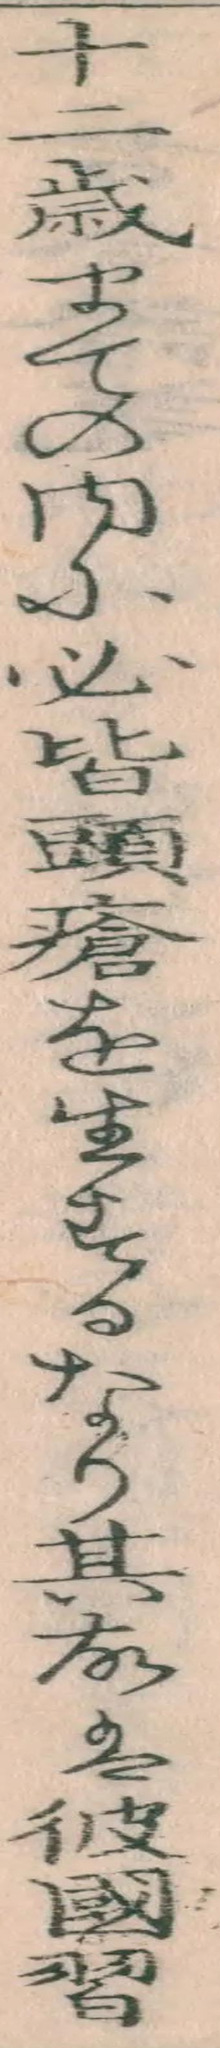十二歳まての内に必皆頭瘡を生するなり其故は彼國習
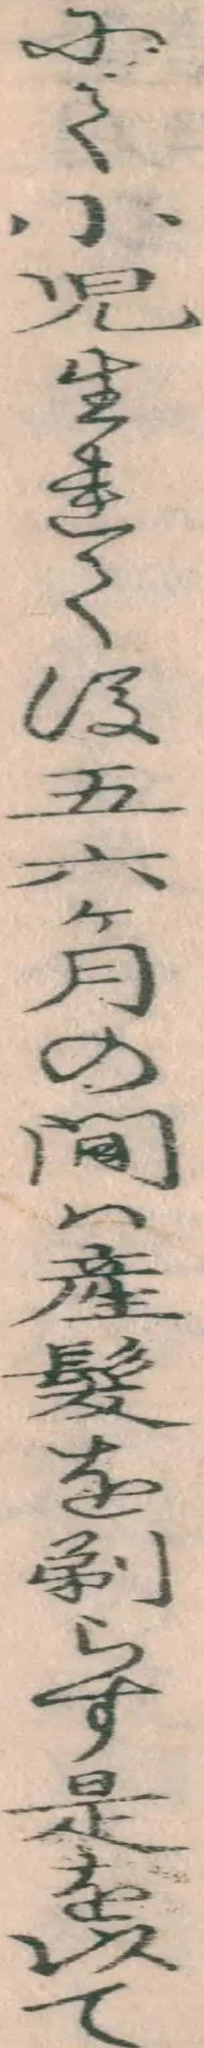にて小児生れて後五六ヶ月の間は産髪を剃らす是を以て
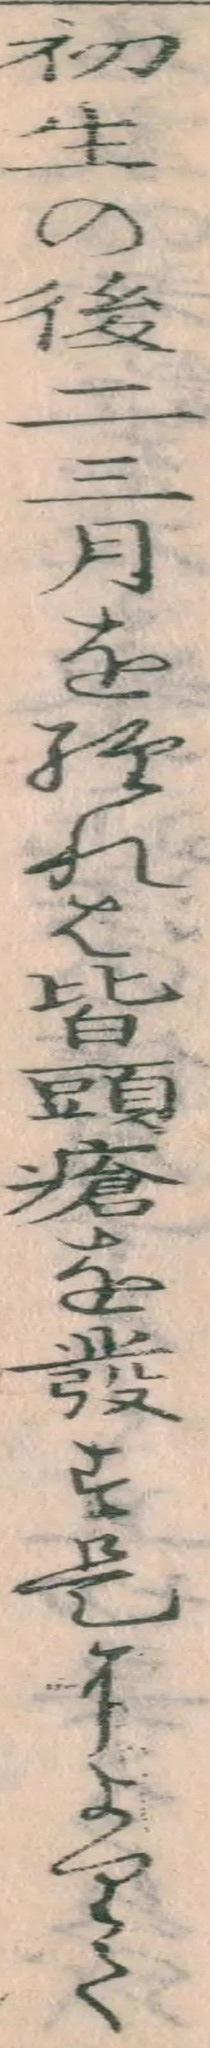初生の二三月を経れは皆頭瘡を發す是によりて
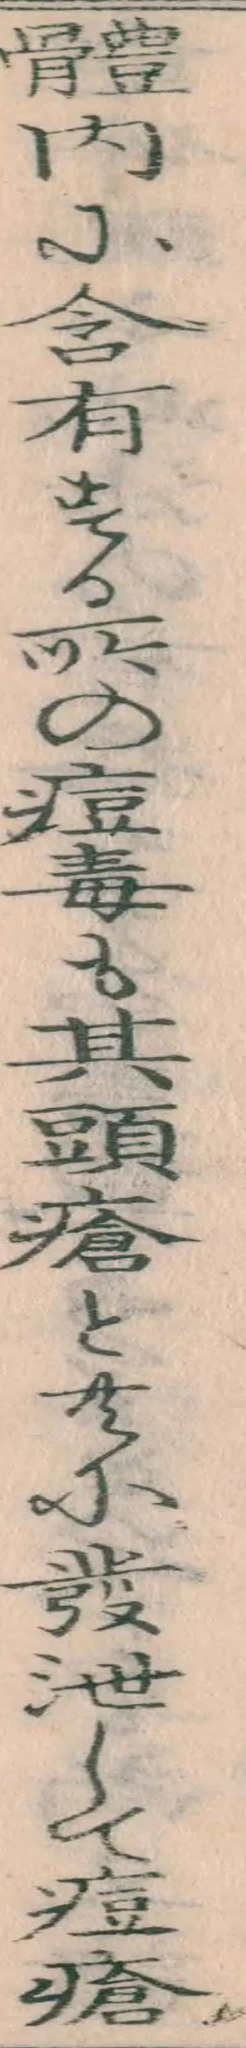體内に含有する所の痘毒も其頭瘡と其に發泄して痘瘡
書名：種痘新編
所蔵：国立国会図書館 National Diet Library, JAPAN
